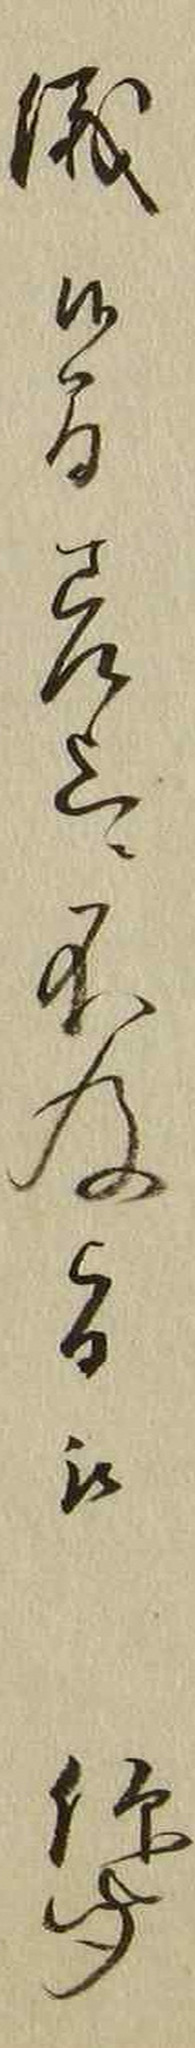儀候間差上ニ不及旨被仰聞
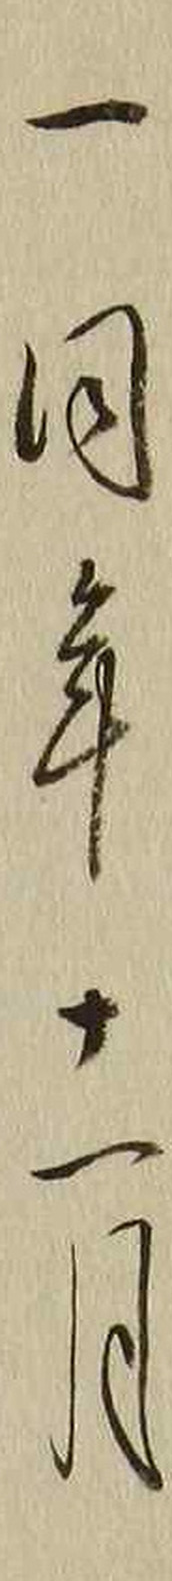一同年十一月
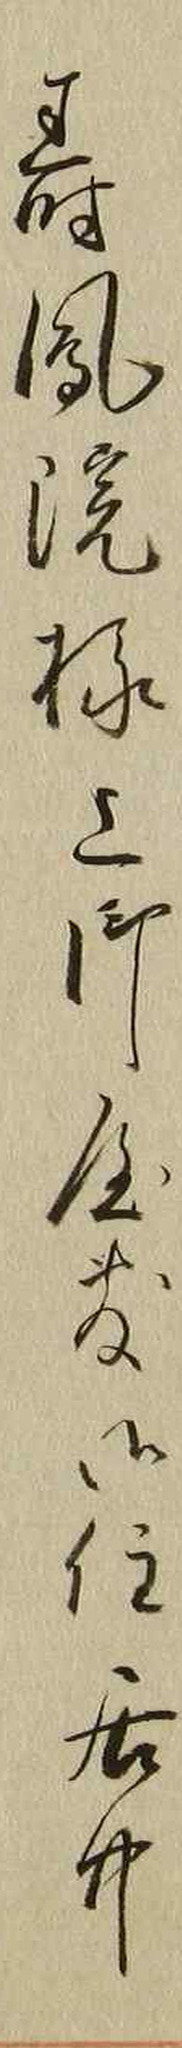寿鳳院様上御屋敷御住居中
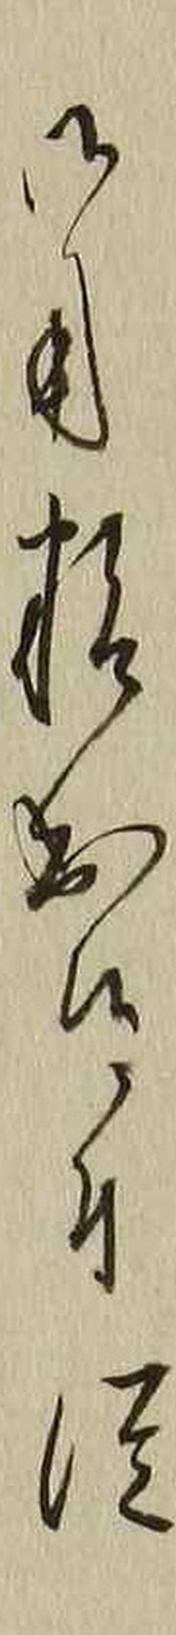御用精出候ニ付従
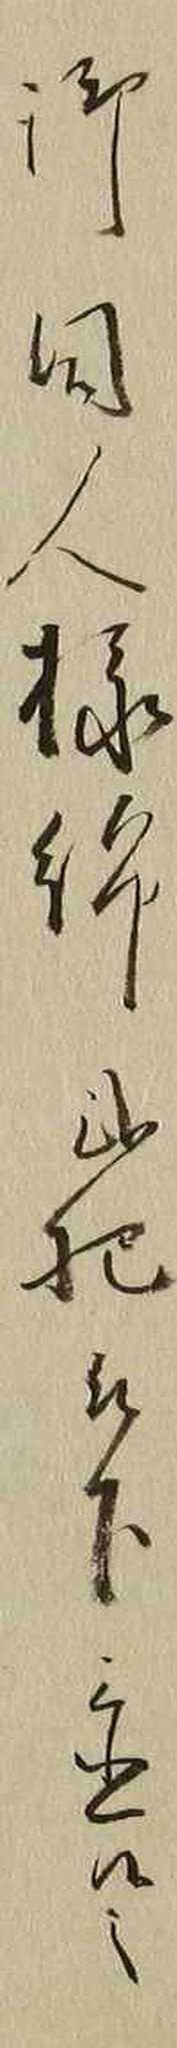御同人様綿弐把被下置候之
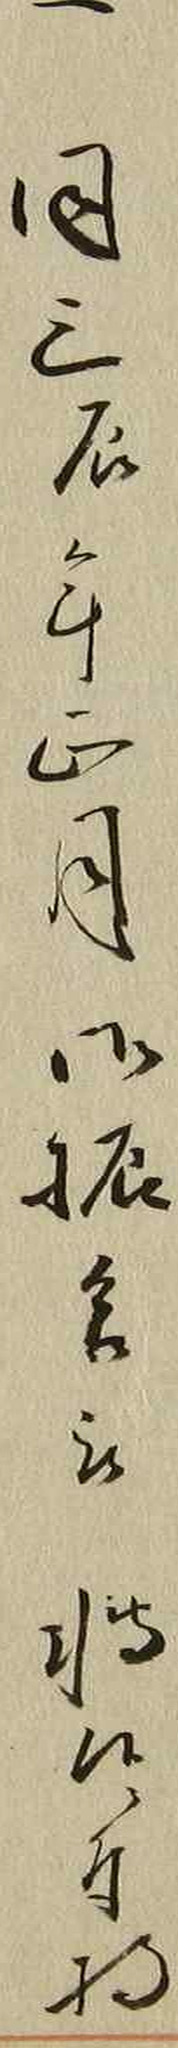一同三辰年正月御振合被転候ニ付持
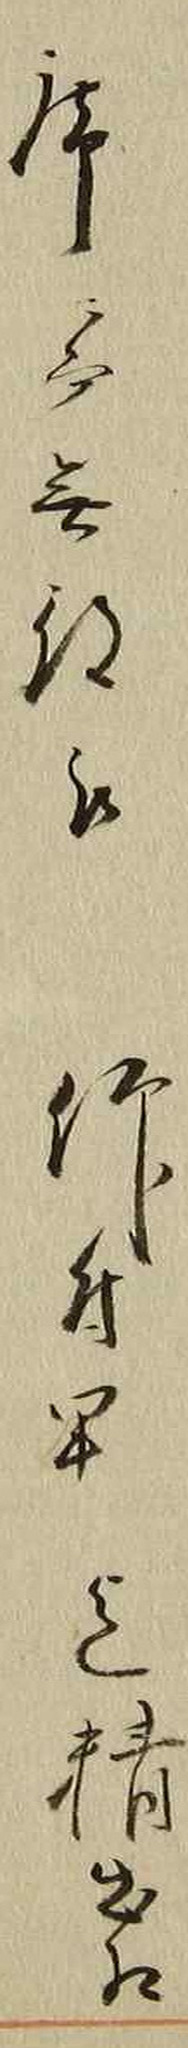席ニ而無役被仰付畢迄精出相
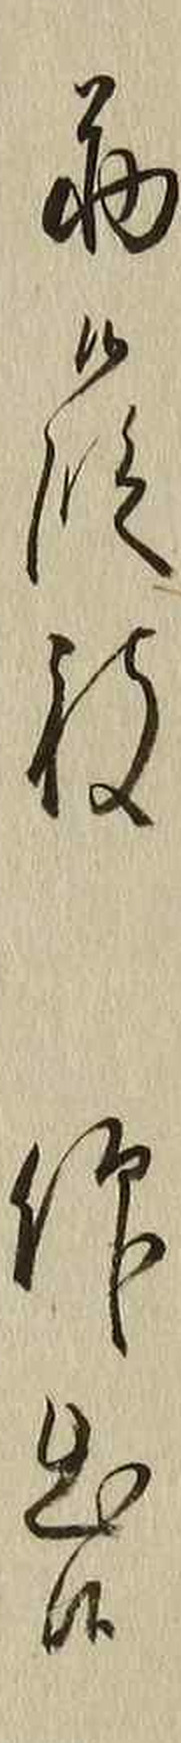勤候段被仰出候
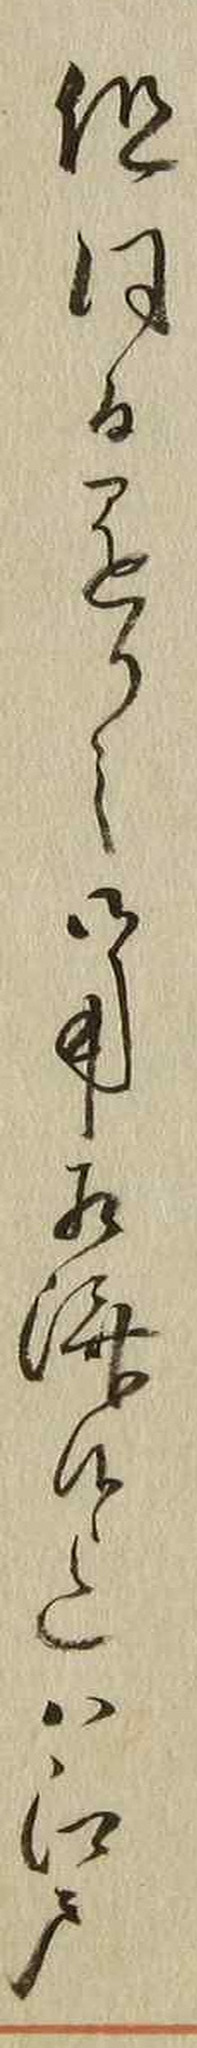但同日懸り之御用相済候迄ハ江戸
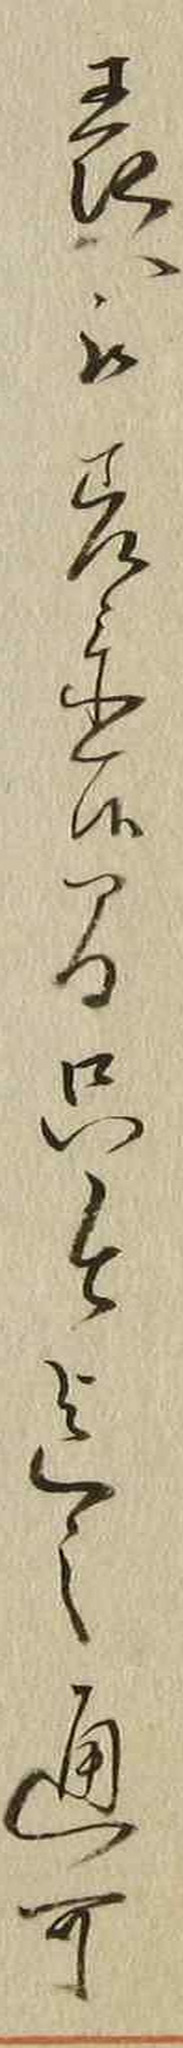表江被差置候間只今迄之通可
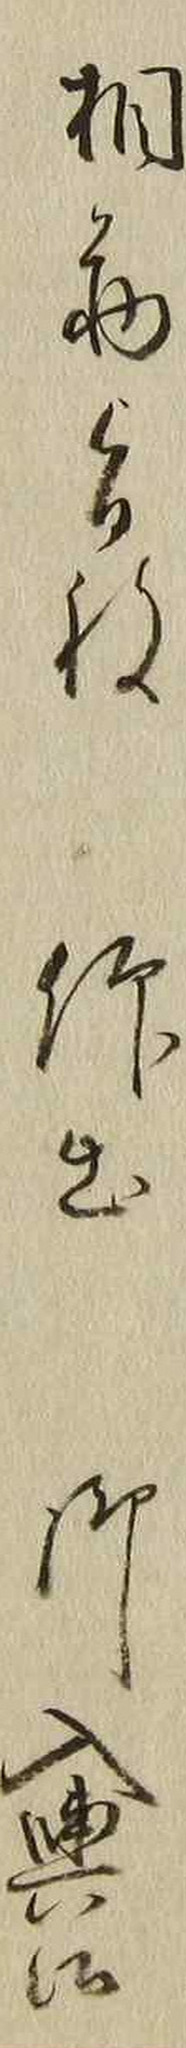相勤旨被仰出御入輿御
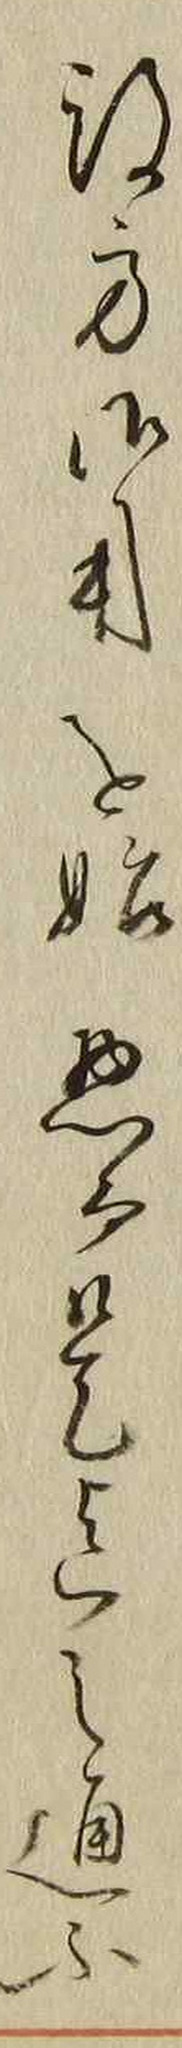役方御用を始惣而是迄之通不
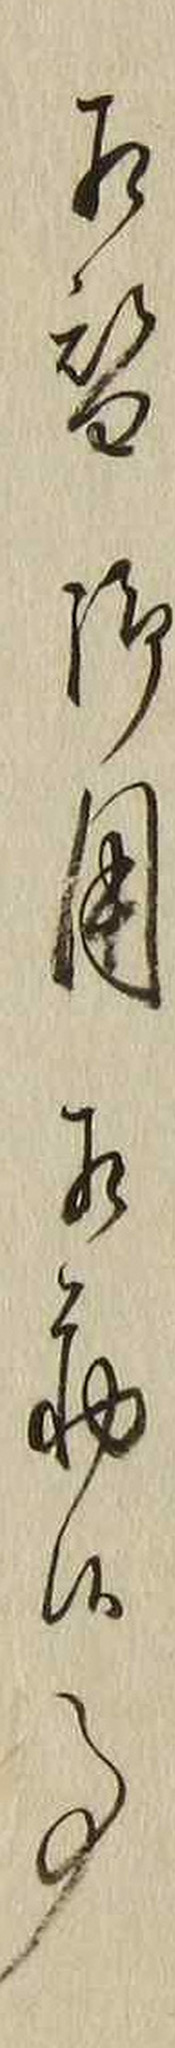相替御用相勤候事
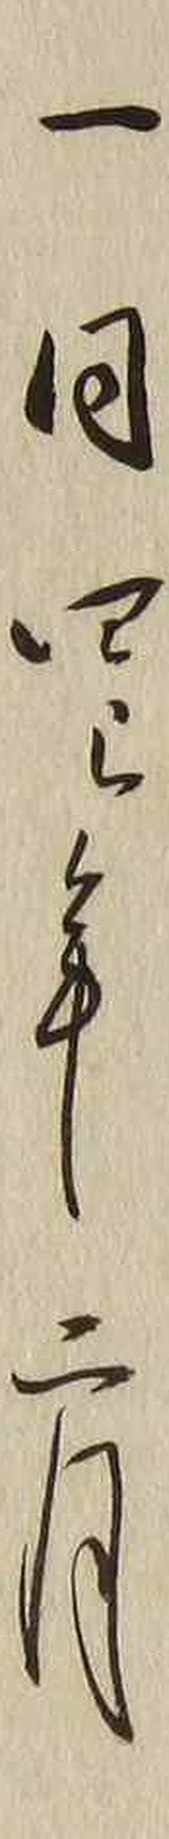一同四巳年二月
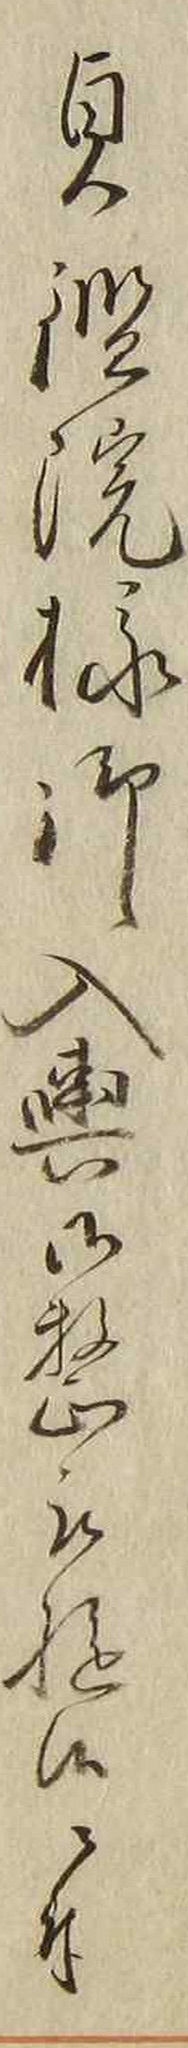貞鑑院様御入輿御整被遊候ニ付
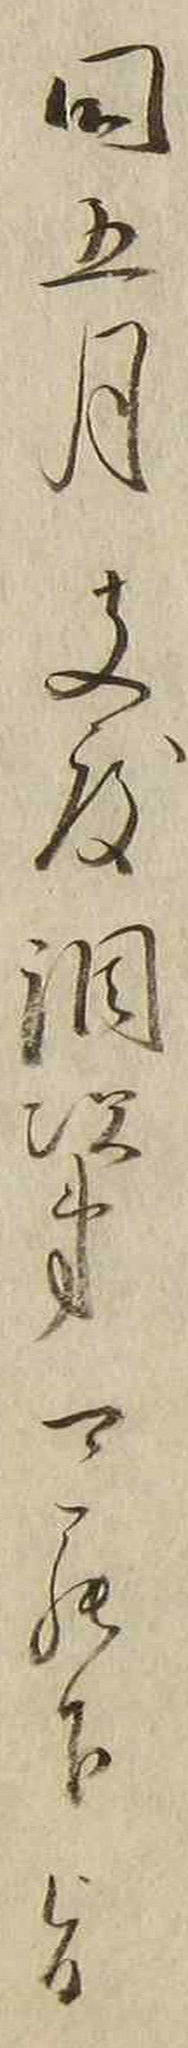同五月支度調次第可罷下旨
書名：諸士系譜　巻之68　を之部2
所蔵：会津若松市立会津図書館
